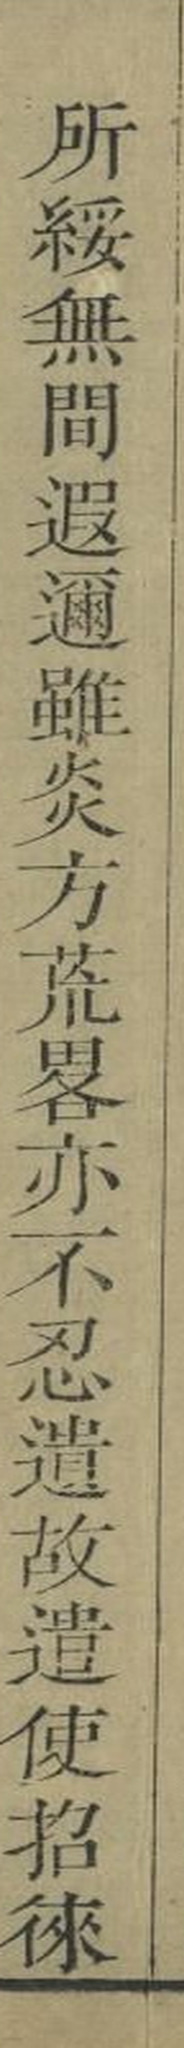所綏無間遐邇雖炎方荒略亦不忍遺故遣使招徠
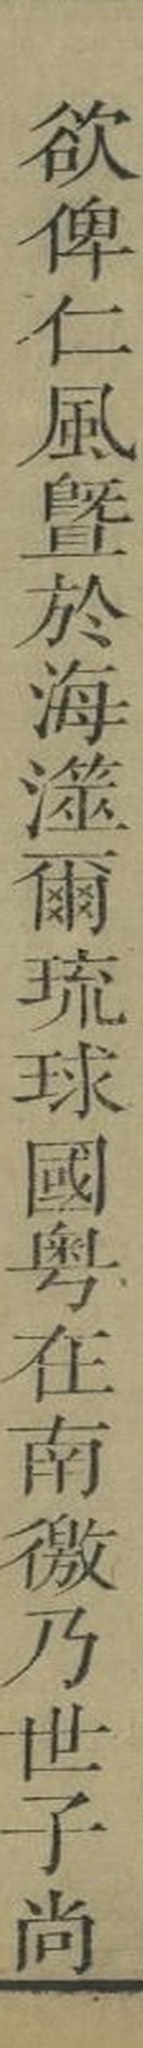欲俾仁風曁於海澨爾琉球国粤在南徼乃世子尚
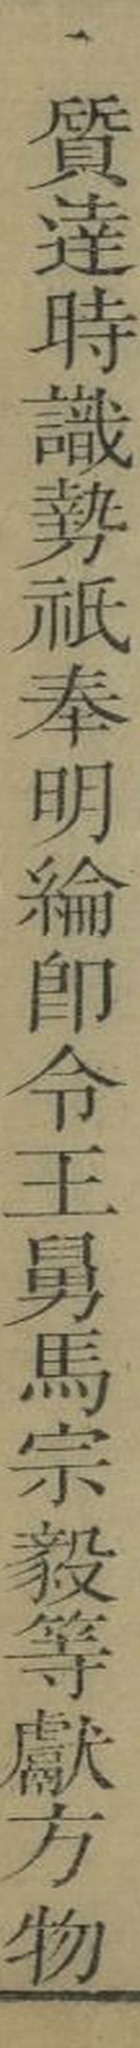質達時識勢祇奉明綸即令王舅馬宗毅等献方物

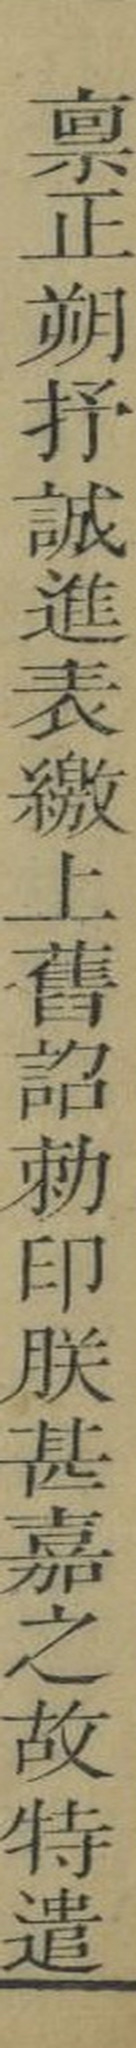稟正朔抒誠進表繳上旧詔勅印朕甚嘉之故特遣
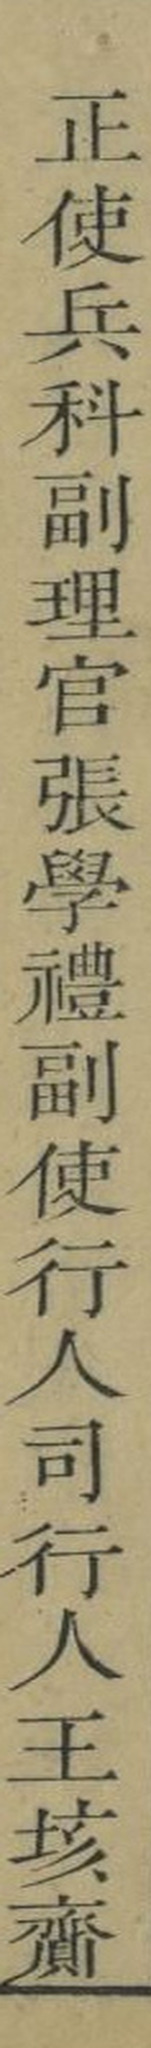正使兵科副理官張学礼副使行人司行人王垓齎
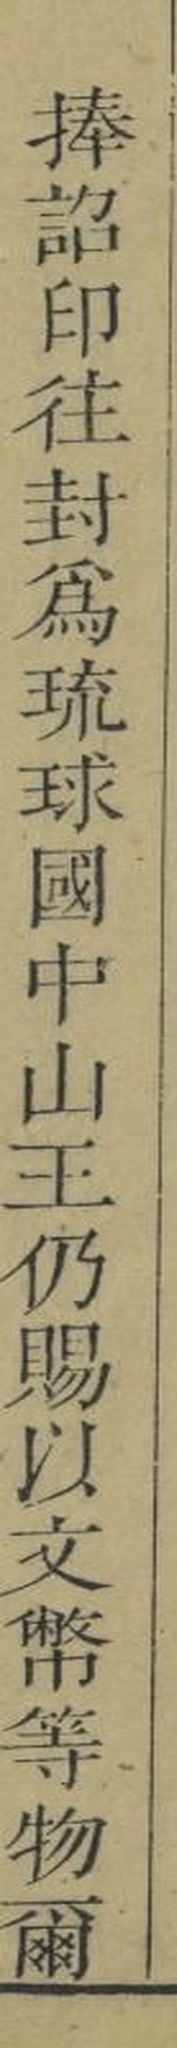捧詔印往封為琉球国中山王仍賜以文幣等物爾
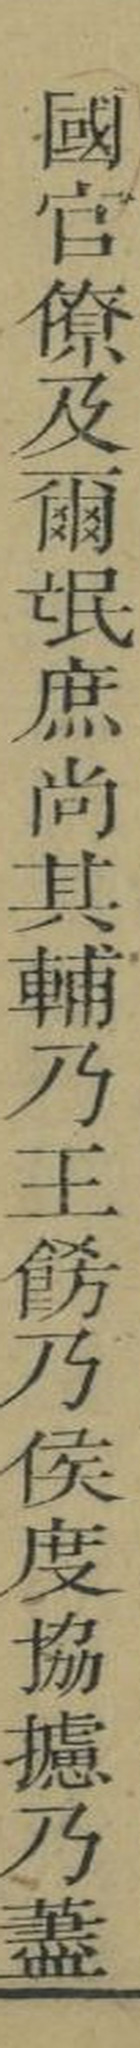国官僚及爾氓庶尚其輔乃王飾乃侯度協攄乃藎
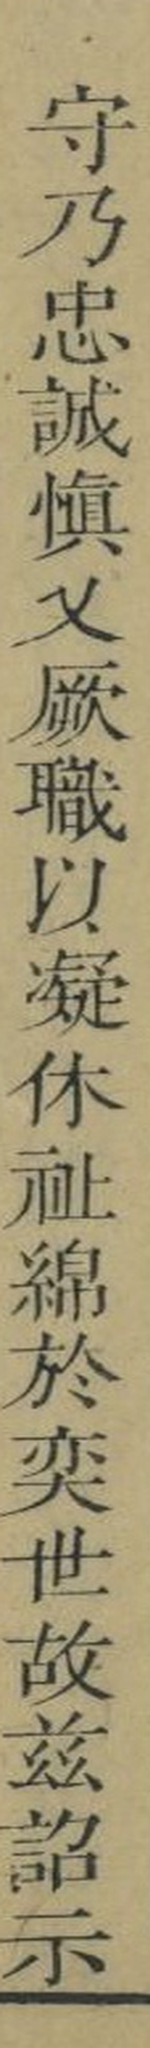守乃忠誠慎乂厥職以凝休祉綿於奕世故茲詔示
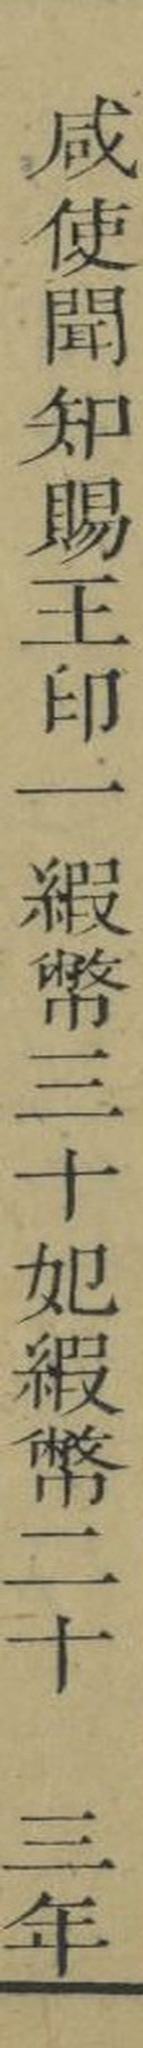咸使聞知賜王印一緞幣三十妃緞幣二十三年
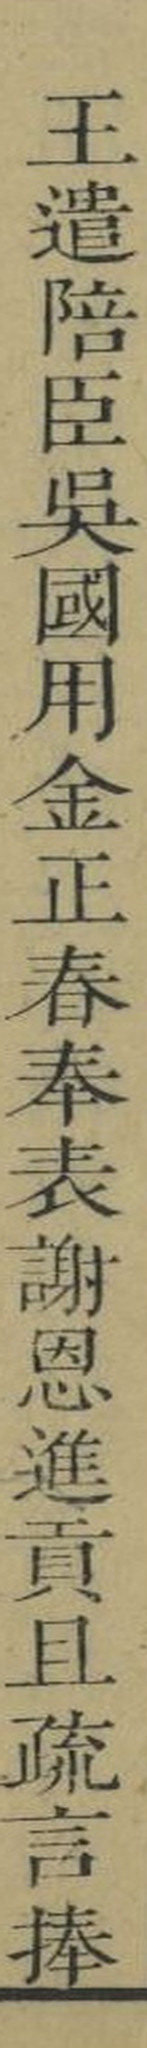王遣陪臣呉国用金正春奉表謝恩進貢且疏言捧
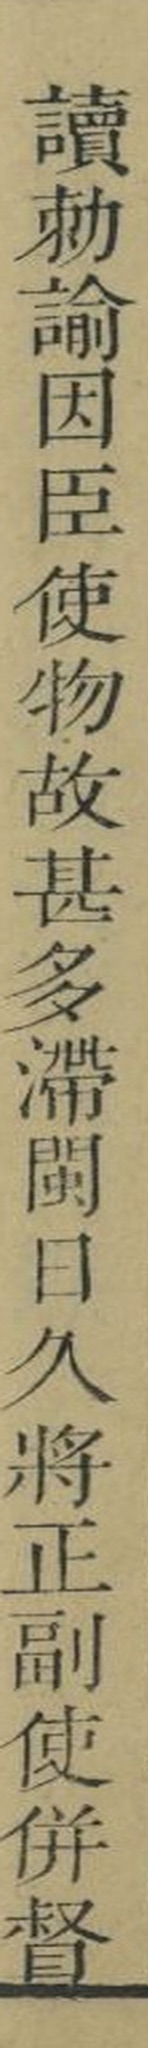読勅諭因臣使物故甚多滞閩日久将正副使併督
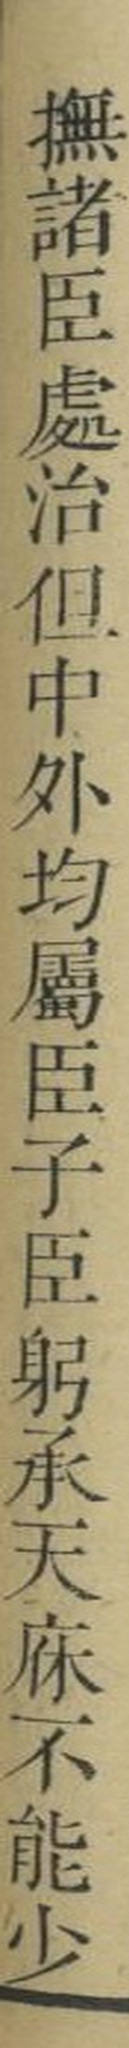撫諸臣処治但中外均属臣子臣躬承天庥不能少
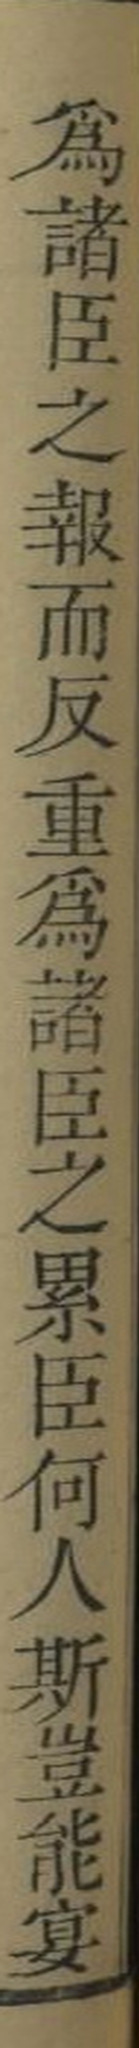為諸臣之報而反重為諸臣之累臣何人斯豈能宴
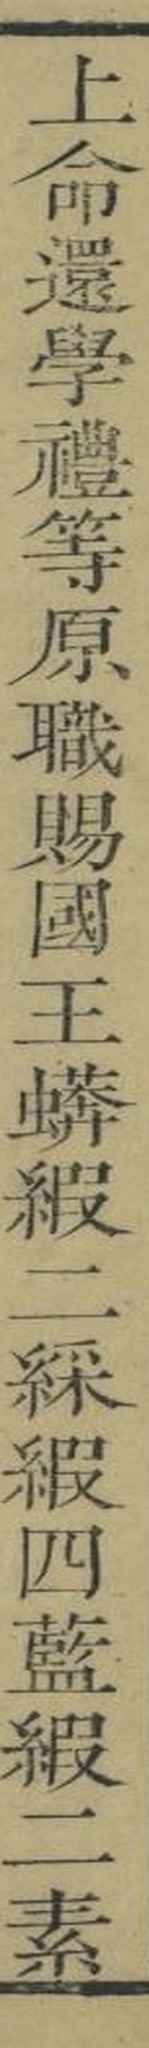上命還学礼等原職賜国王蠎緞二綵緞四藍緞二素
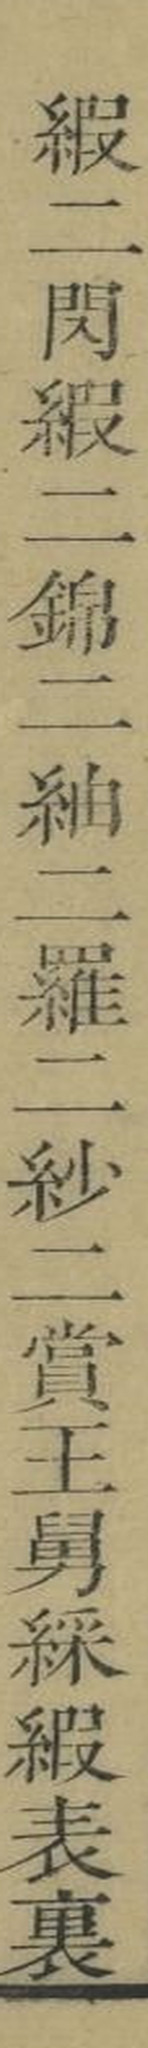緞二緞二錦二紬二羅二紗二賞王舅綵緞表裏
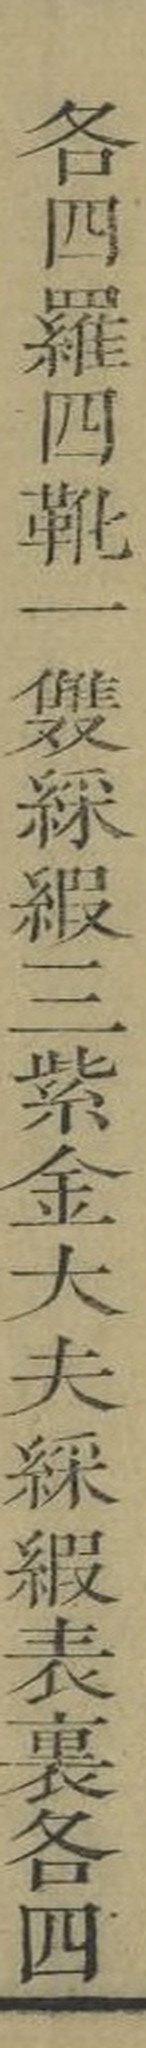各四羅四靴一双綵緞三紫金大夫綵緞表裏各四
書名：中山伝信録 巻三
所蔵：University of the Ryukyus Library
